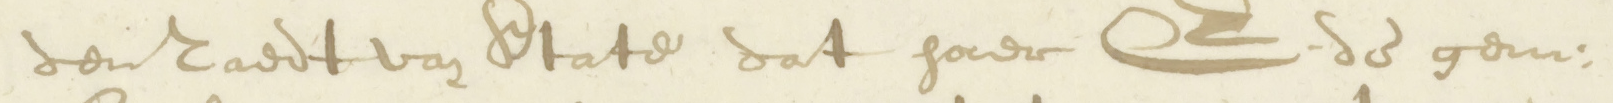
den Raedt van State dat haer E. de gem:
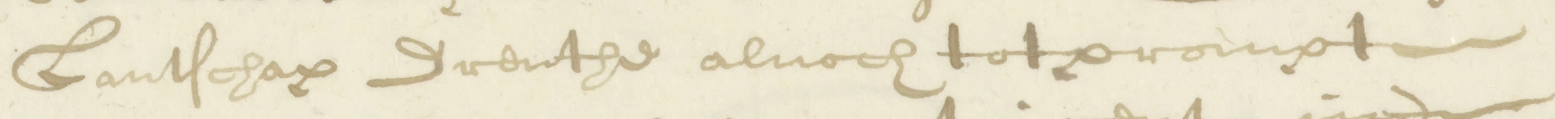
Lantschap Drenthe alnoch tot prompte
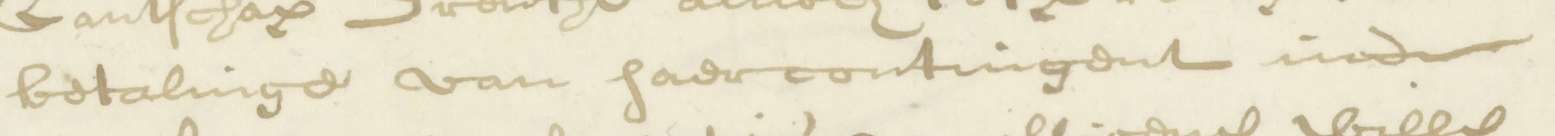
betalinge van haer contingent inde
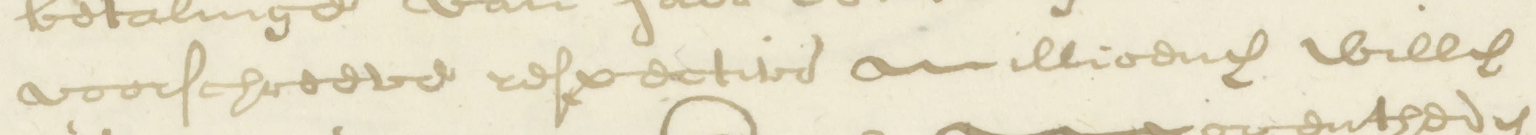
voorschreeve respective millioenen willen
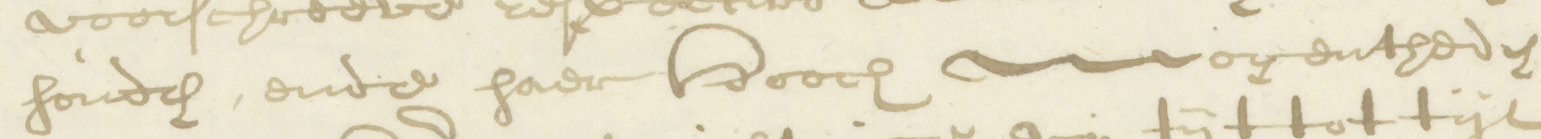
houden, ende haer Hooch Mogentheden
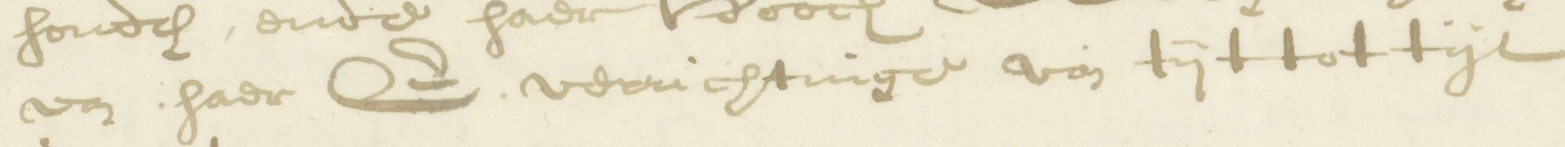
van haer E. verrichtinge van tijt tot tijt
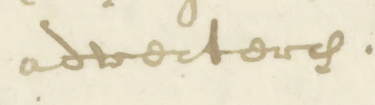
adverteren.
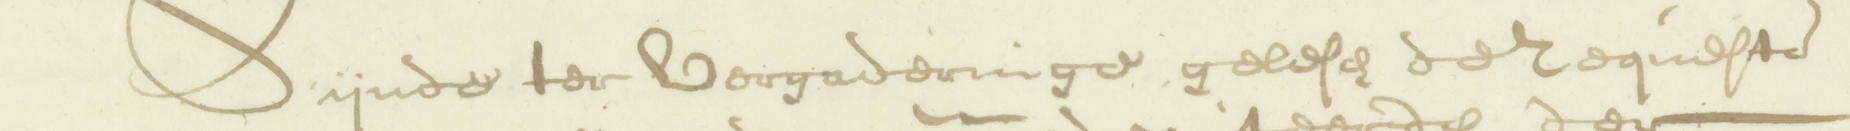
Sijnde ter Vergaderinge gelesen de Requeste
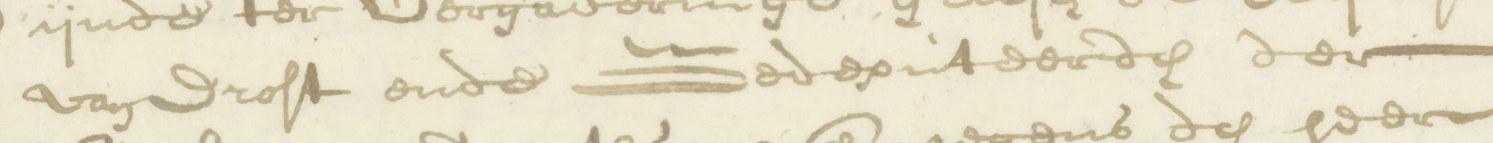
van Drost ende Gedeputeerden der
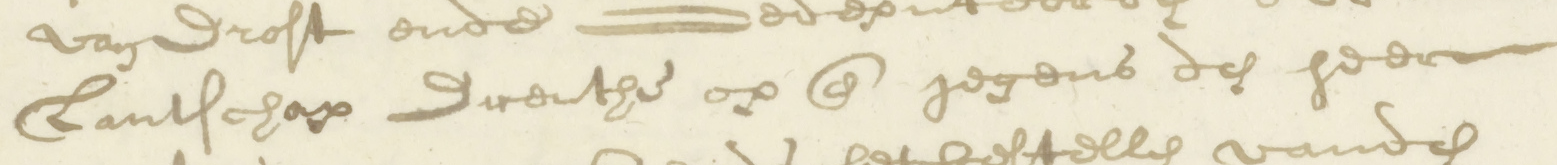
Lantschap Drenthe op & jegens den heer
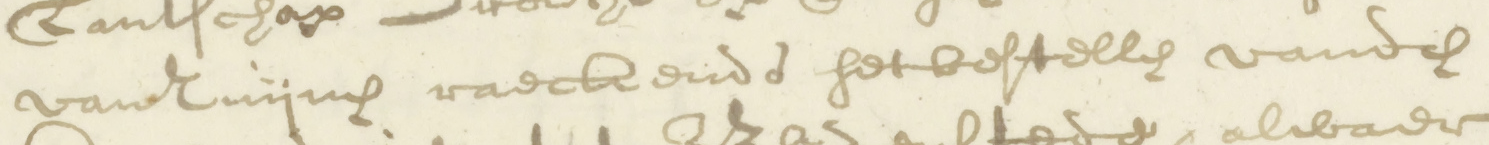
van Ruijnen raeckende het bestellen vanden
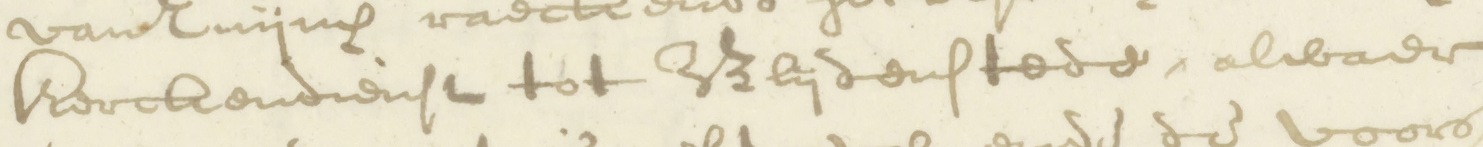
Kerckendienst tot Blijdenstede, alwaer
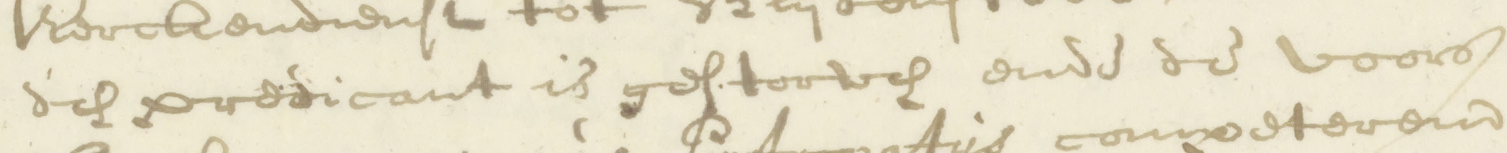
den predicant is gestorven ende de voors
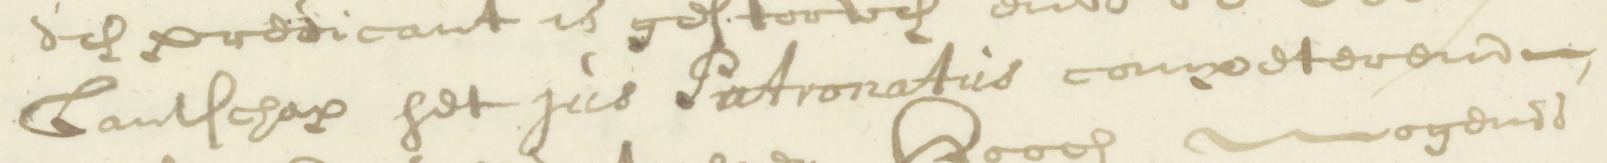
Lantschap het jus Patronatus competerende,
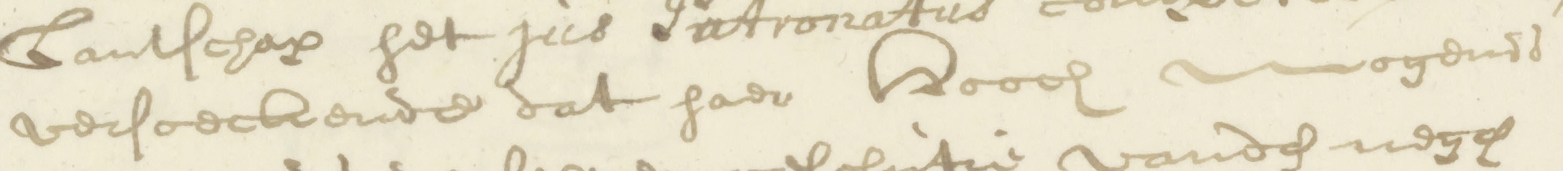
versoeckende dat haer Hooch Mogende
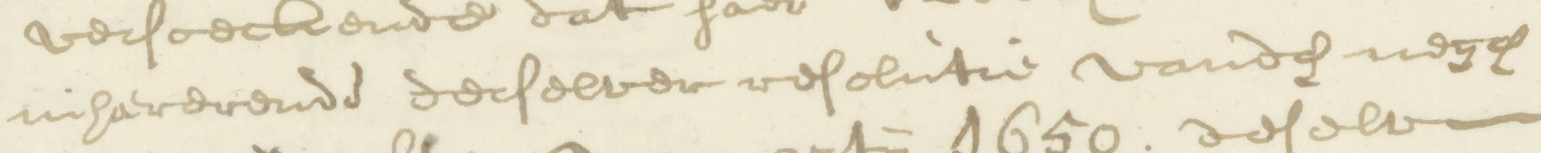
inhererende derselver resolutie vanden negen
